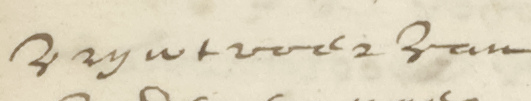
vrij wtvoer van
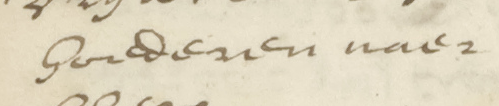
goederen naer
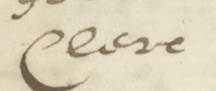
Cleve
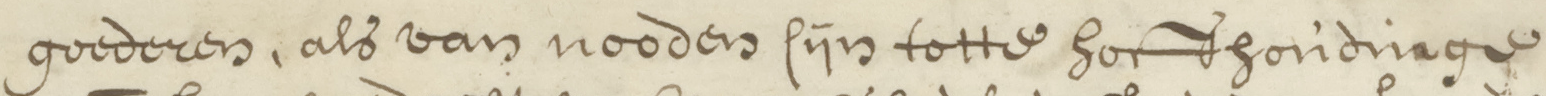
goederen, als van nooden sijn totte hoffhoudinge
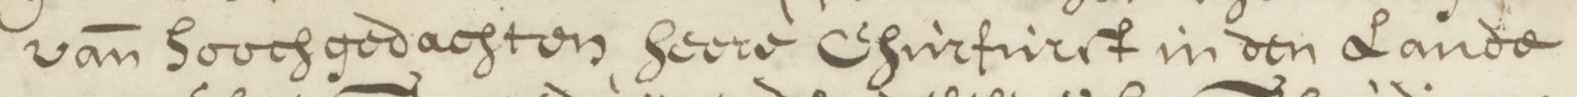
van hoochgedachten heere Churfurst in den Lande
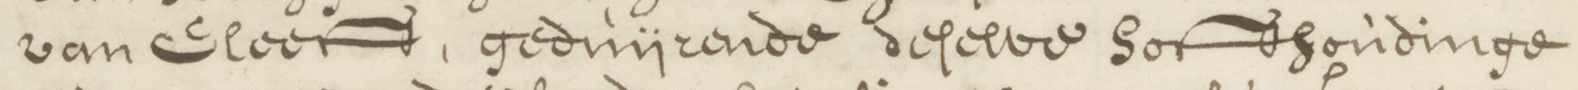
van Cleeff, geduijrende deselve hoffhoudinge
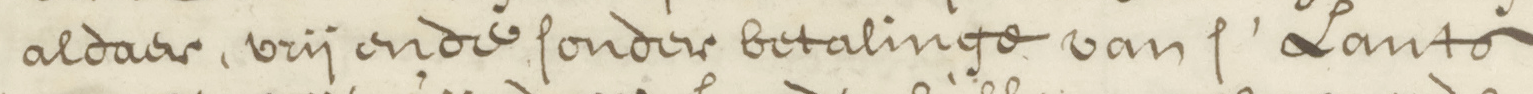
aldaer, vrij ende sonder betalinge van s‛ Lants
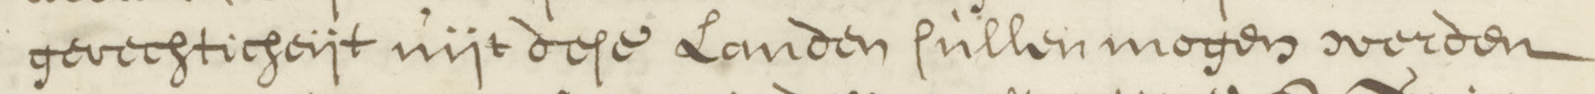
gerechticheijt uijt dese Landen sullen mogen worden
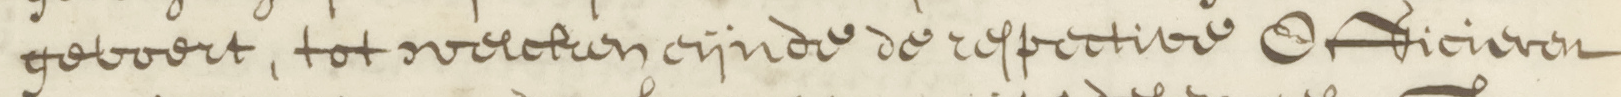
gevoert, tot welcken eijnde de respective Officieren
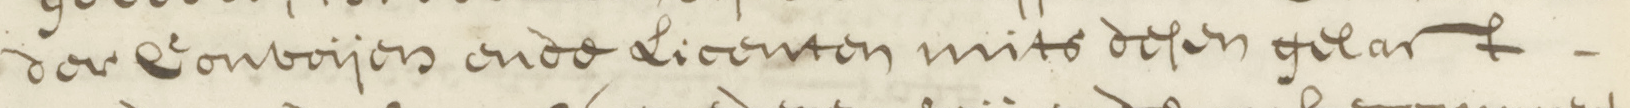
der Convoijen ende Licenten mits desen gelast -
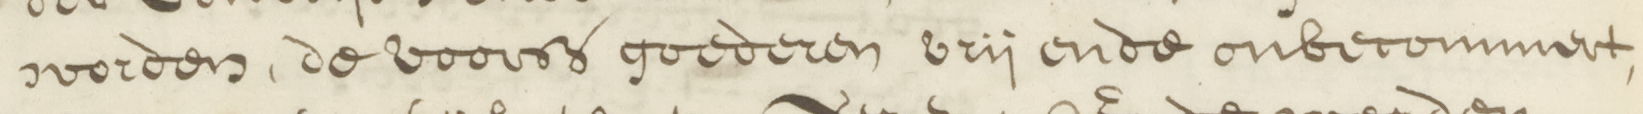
worden, de voorss goederen vrij ende onbecommert,
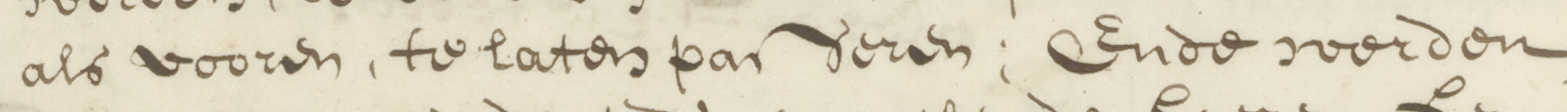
als vooren, te laten passeren; Ende werden
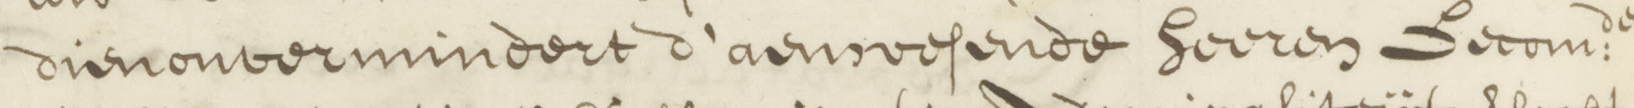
dienonvermindert d‛aenwesende heeren Gecomden:
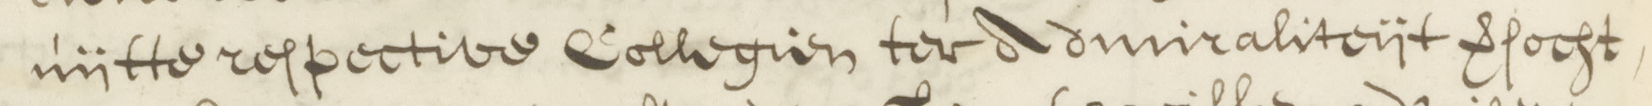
uijtte respective Collegien ter Admiraliteijt vsocht
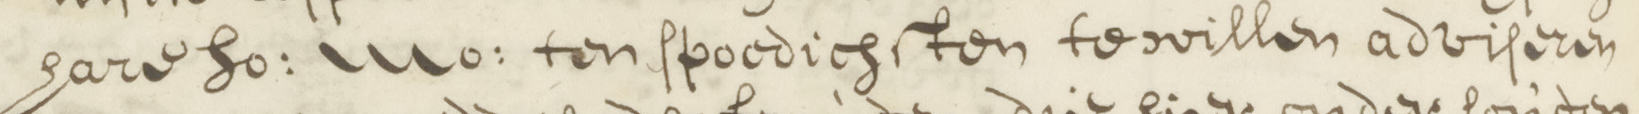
hare ho:Mo: ten spoedichsten te willen adviseren,
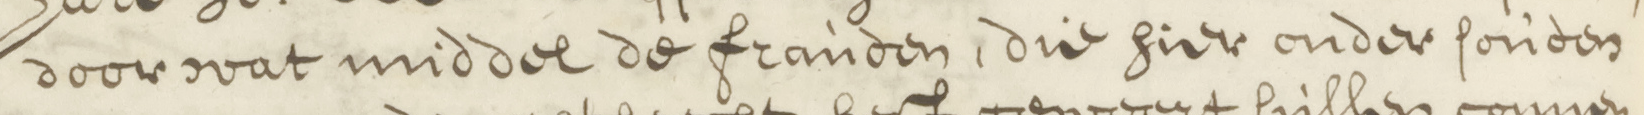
door wat middel de frauden, die hier onder souden
